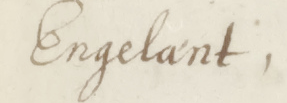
Engelant.
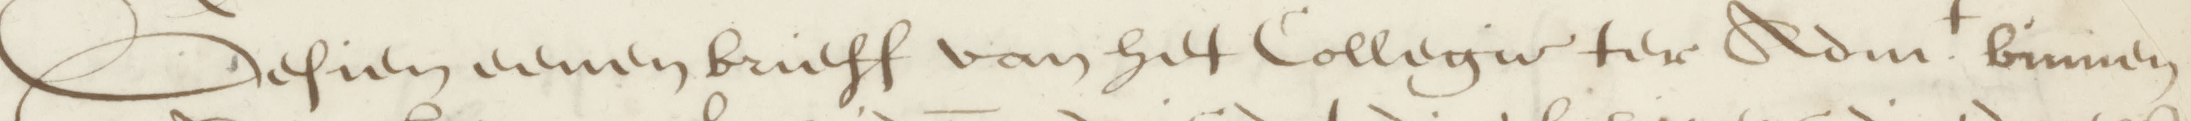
Gesien eenen brieff van het Collegie ter Admt. binnen
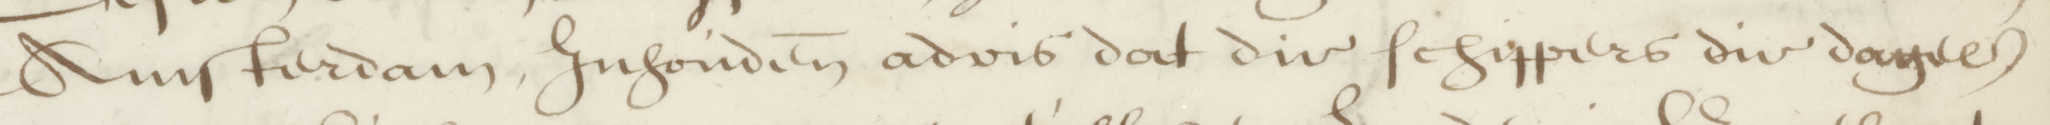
Amsterdam, Inhouden advis dat die schippers die dagel
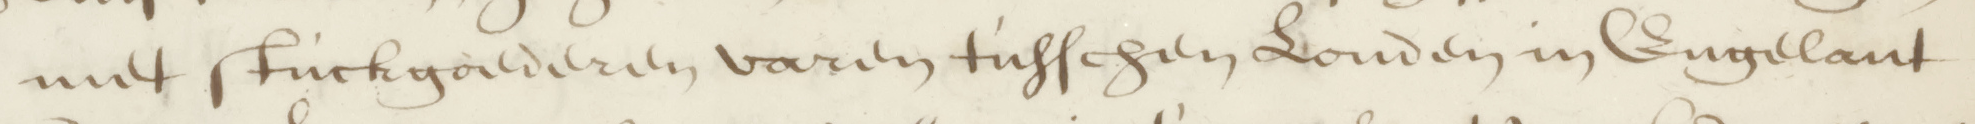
met stuckgoederen varen tusschen Londen in Engelant
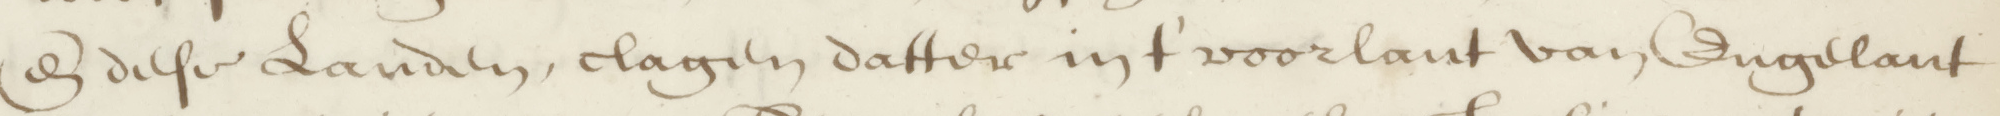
& dese Landen, clagen datter in t'voorlant van Engelant
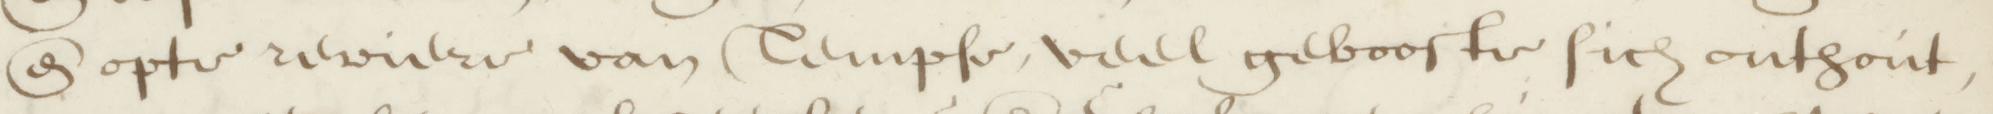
& opte reviere van Tempse, veel gebooste sich onthout,
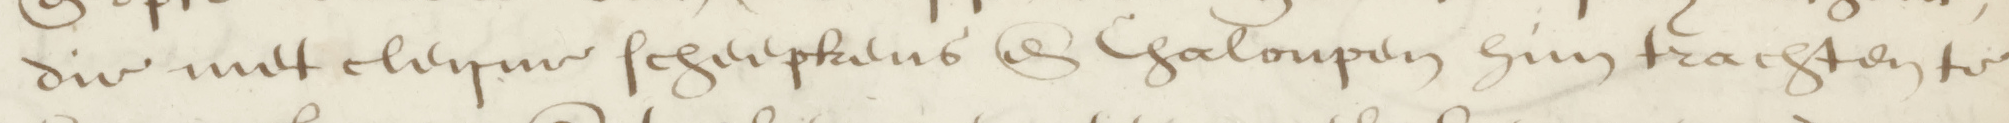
die met cleyne scheepkens & Chaloupen hun trachten te
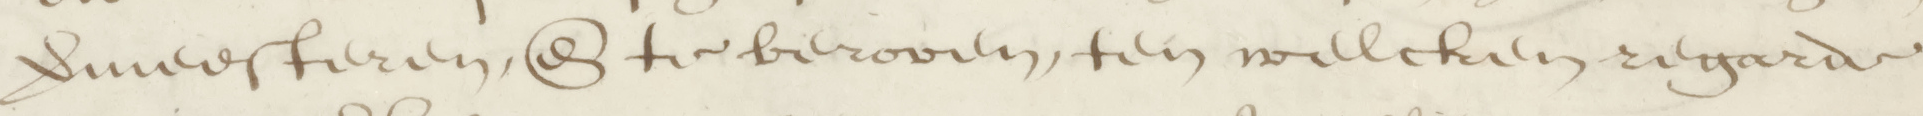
vmeesteren, & te beroven, ten welcken regarde
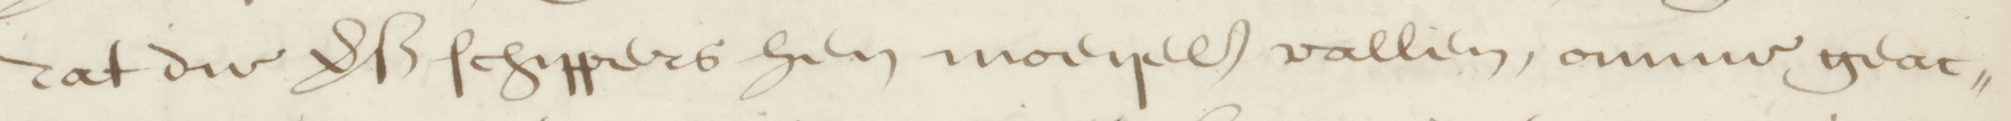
dat die vs schippers hen moeyel vallen, omme geac,,
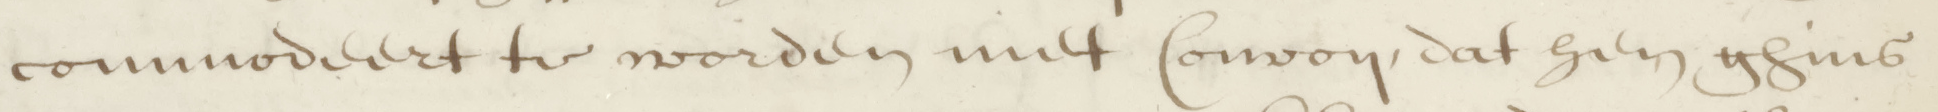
commodeert te worden met Convoy, dat hen ghins
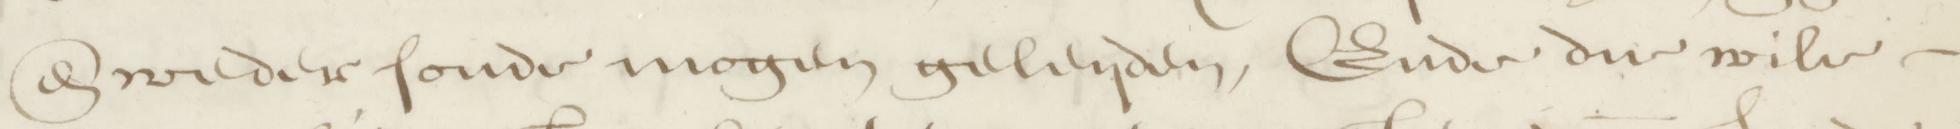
& weder soude mogen geleyden. Ende die wile
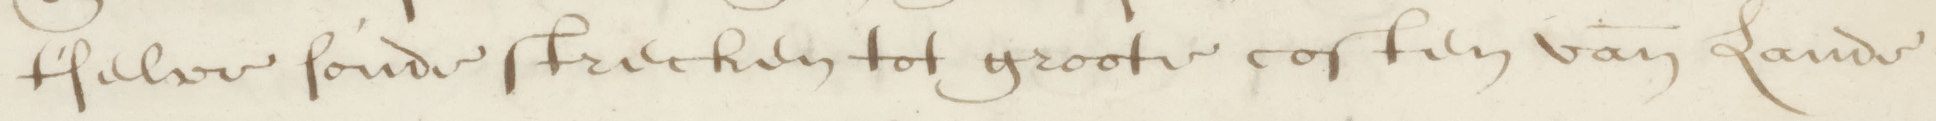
t'selve soude strecken tot groote costen van Lande
